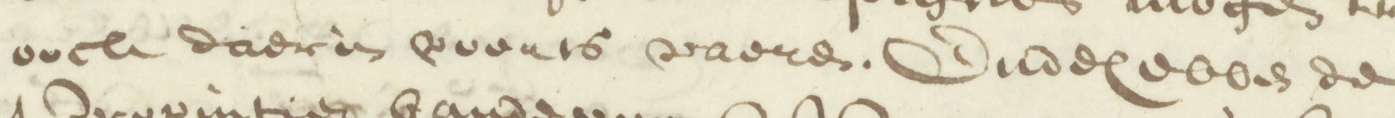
oock daerin voorts vaeren. Ende hebben de
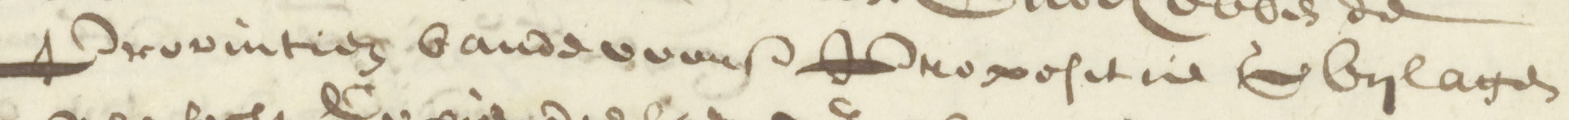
Provintien vande voors Propositie & bylagen
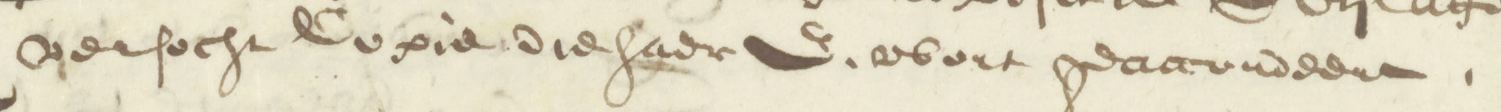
versocht Copie, die haer E. wort geaccordeert.
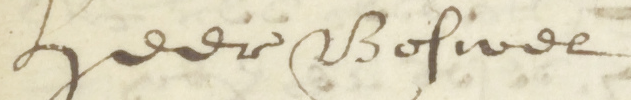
Heer Boswel
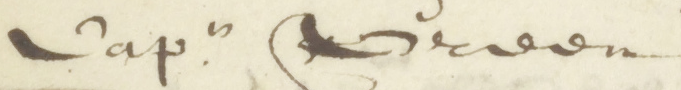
Capn. Green
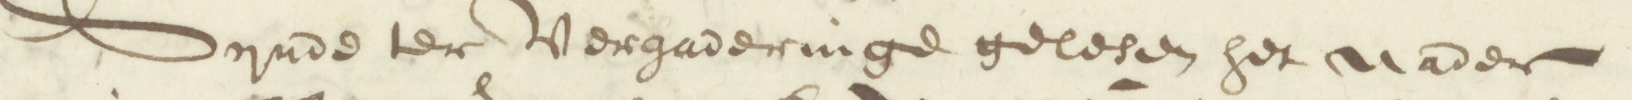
Synde ter Vergaderinge gelesen het nader
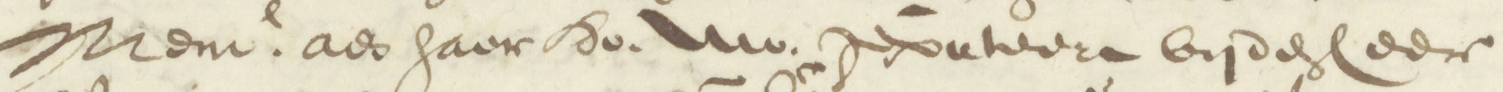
Meml. aen haer Ho.Mo. geputeert by den heer
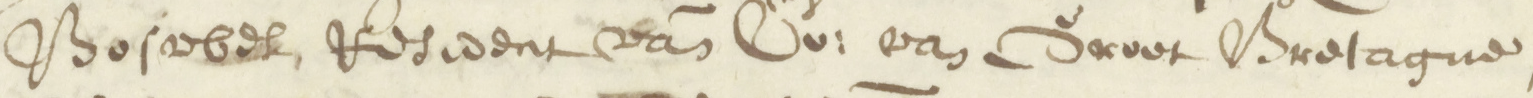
Boswel, Resident van Co: van Groot Bretagne,
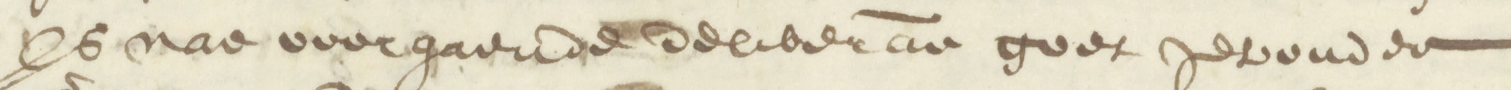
Is nae voorgaende deliberae goet gevonden
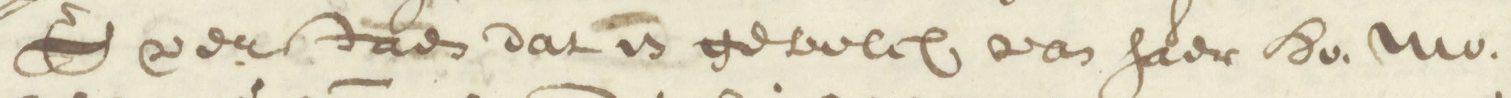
& verstaen dat in gevolch van haer Ho:Mo:
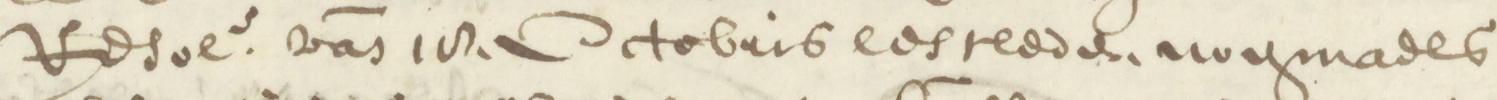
Resole. van 18. Octobris lestleden nochmaels
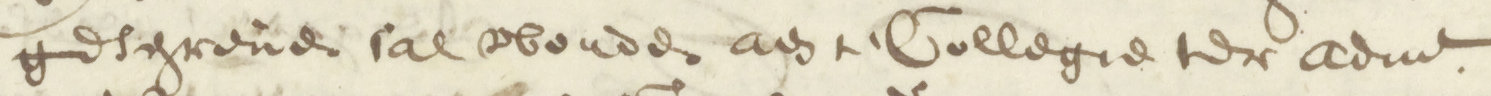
geschreuen sal worden aen t'Collegie ter Admt.
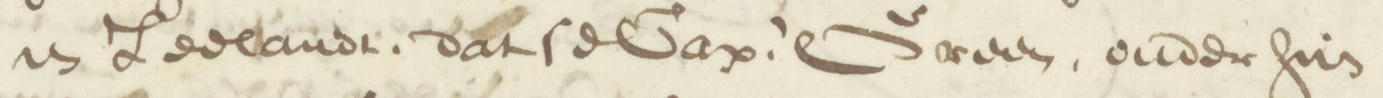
in Zeelandt, datse Capn. Green, onder hun
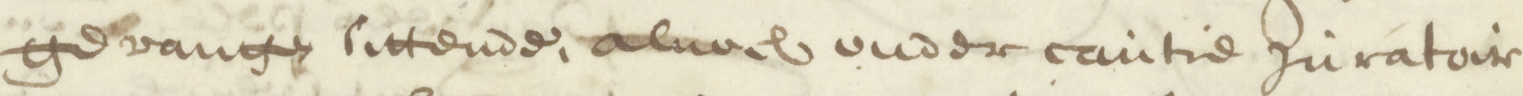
gevangen sittende, alnoch onder cautie Juratoir
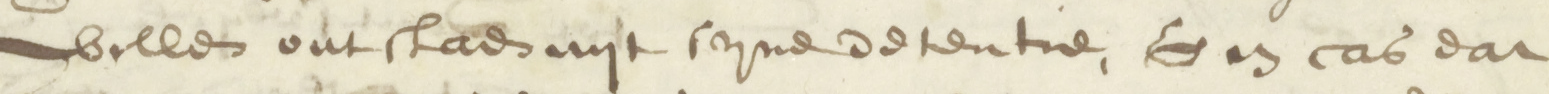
willen ontslaen uyt syne detentie, & in cas dat
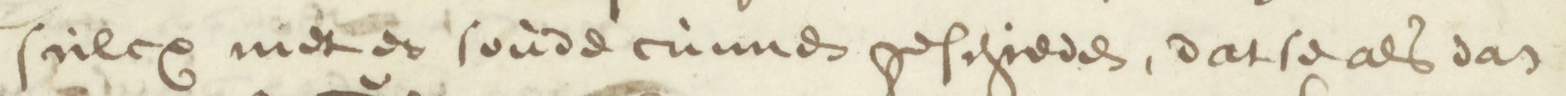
sulcx niet en soude cunnen geschieden, datse als dan
